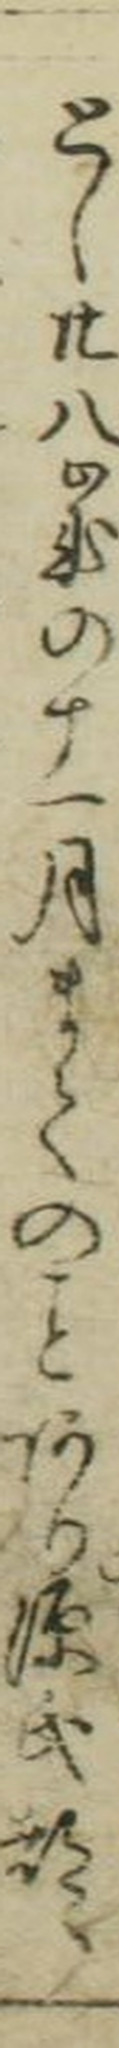とし廿八歳の十一月まてのことあり。源氏都へ
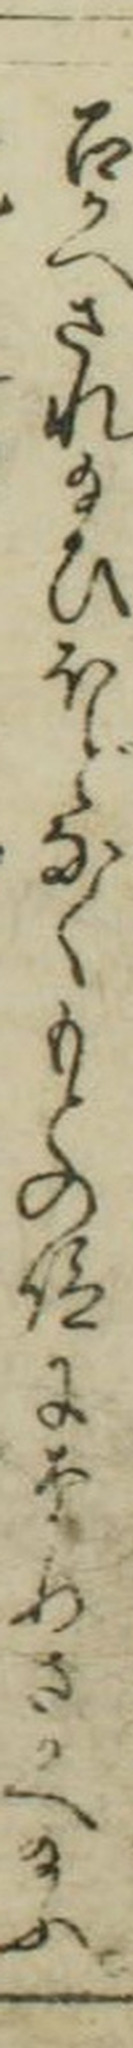召かへされ給ひほどなくもとの位になりさかへ給ふ。
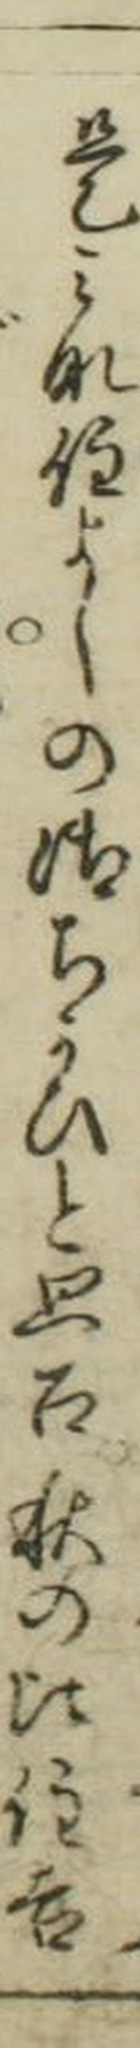是みな住よしの御ちかひと思召。秋の比住吉
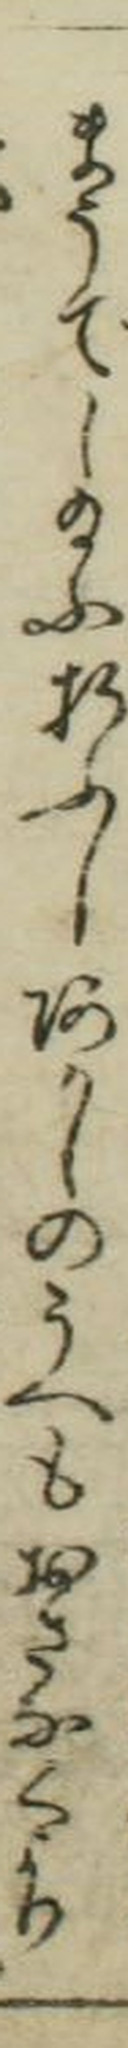まうでし給ふ。折ふしあかしのうへもおさなくより
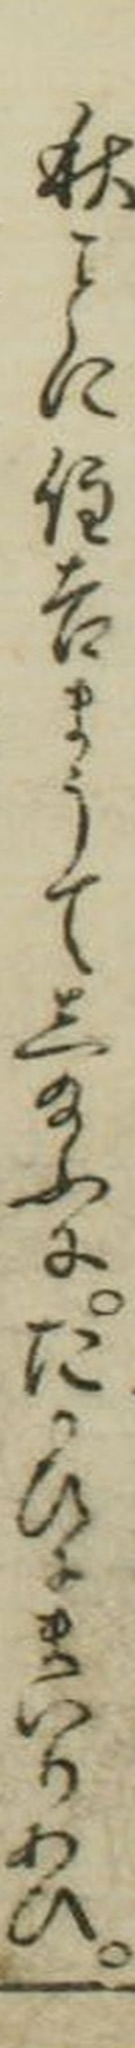秋ことに住吉まうてし給ふに。たかひにまいりあひ。
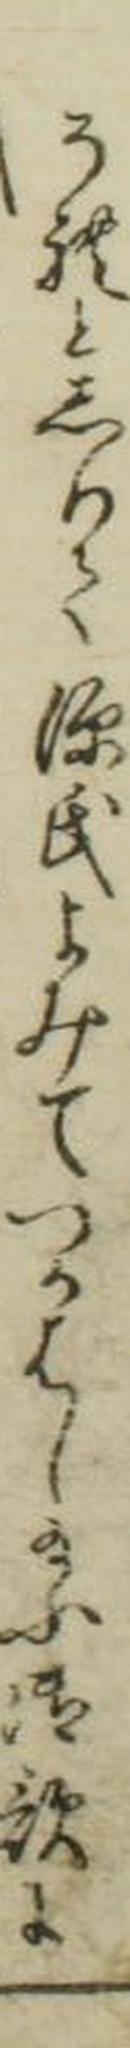それとしりて源氏よみてつかはし給ふ御歌に
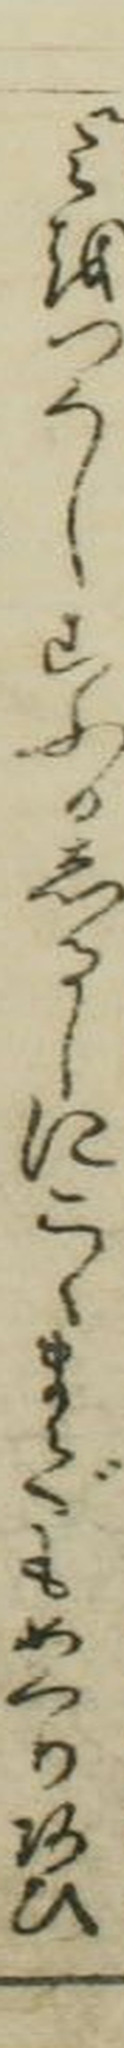〽みをつくしこふるしるしにこゝまでもめくりあひ
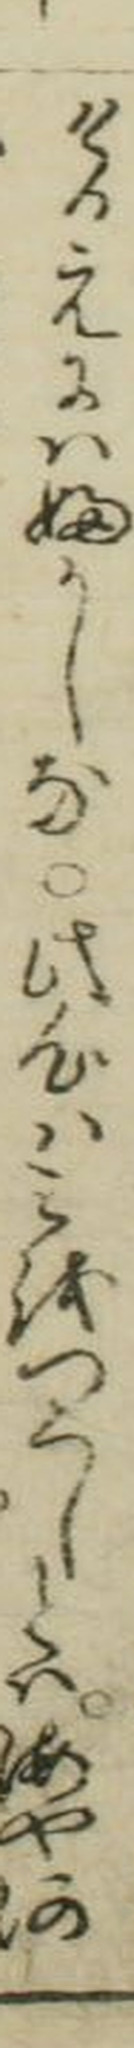けるえにはふかしな○此心はみをつくしとは。海や河
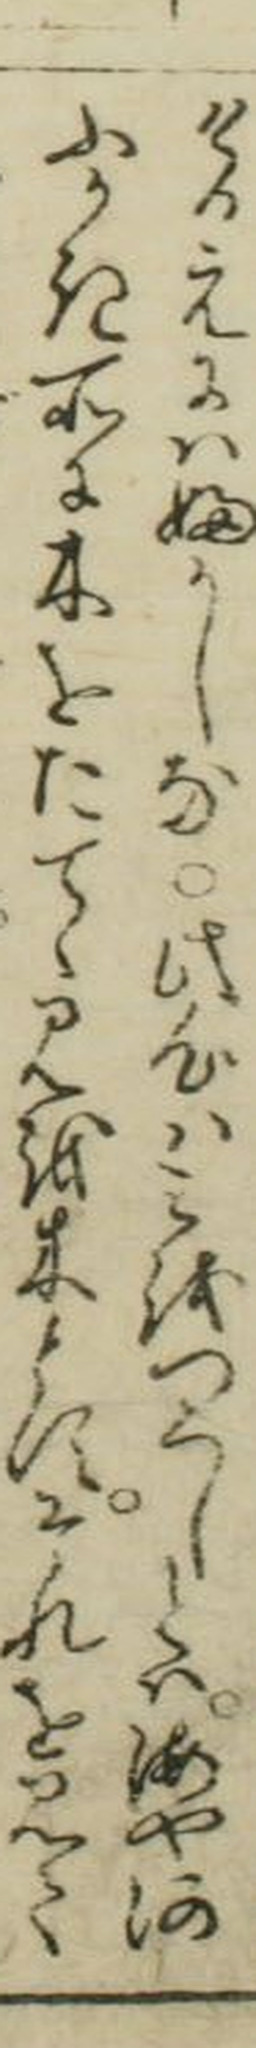ふかき所に木をたてゝみを木とす。それを見て
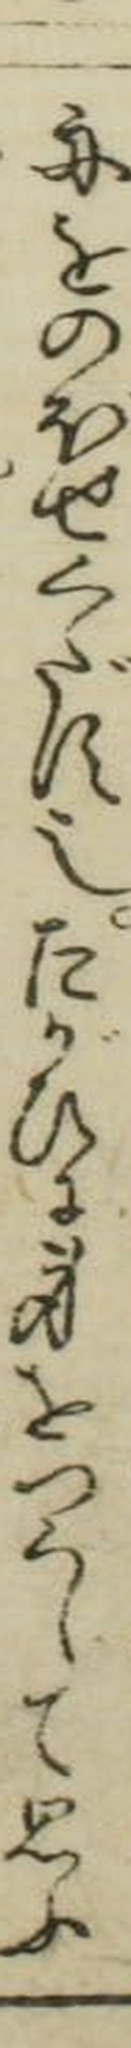舟をのぼせくだす也。たがひに身をつくして思ふ
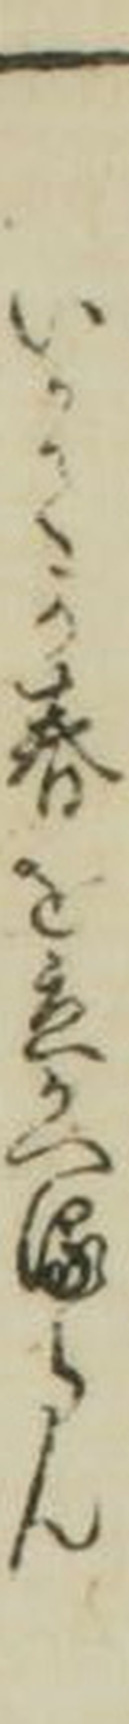いかてか春を立かへるらん
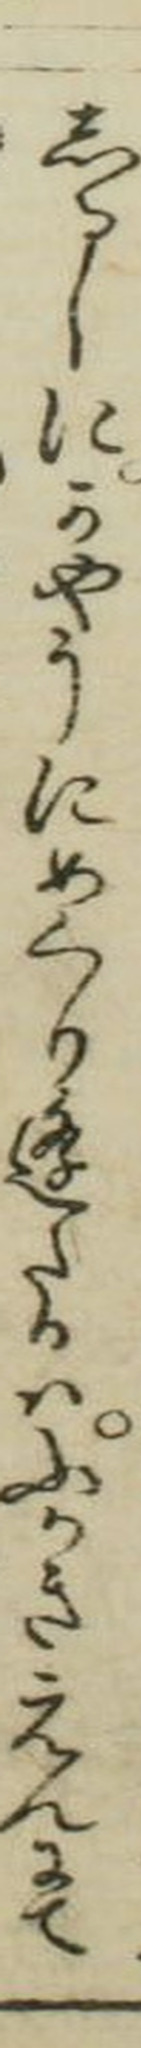しるしに。かやうにめくり逢たるは。ふかきえんにて
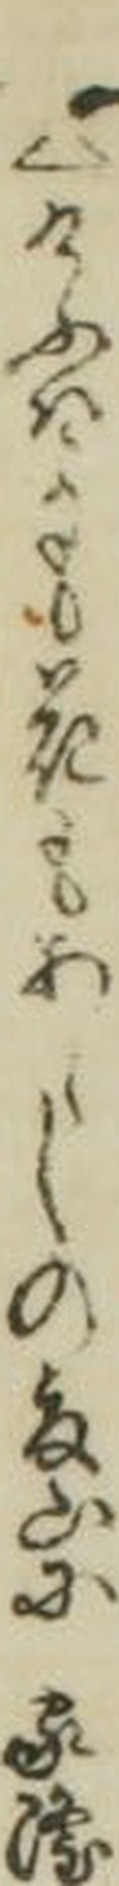△けふはよも花もあらしの夏山に家隆
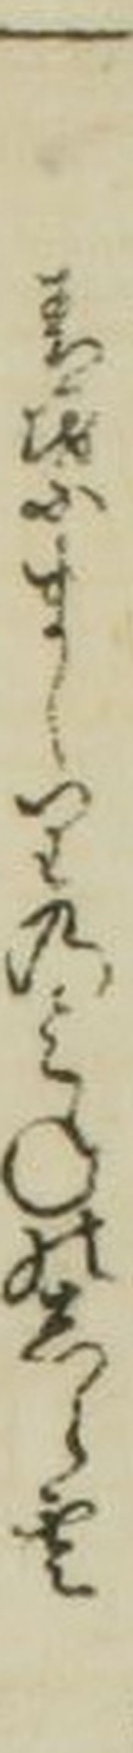青葉ましりのみねのしら雲
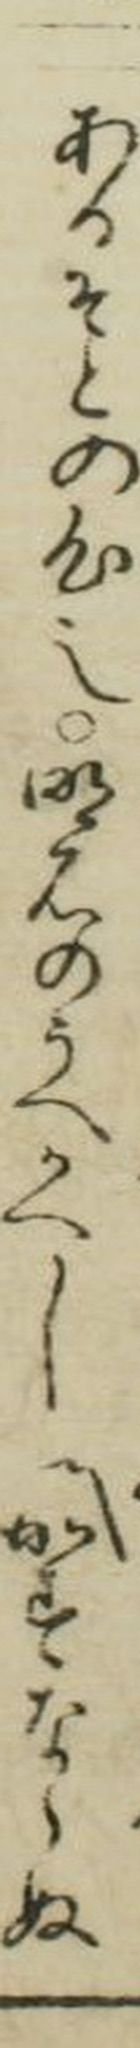あるそとの心也。明石のうへかへし〽かすならぬ
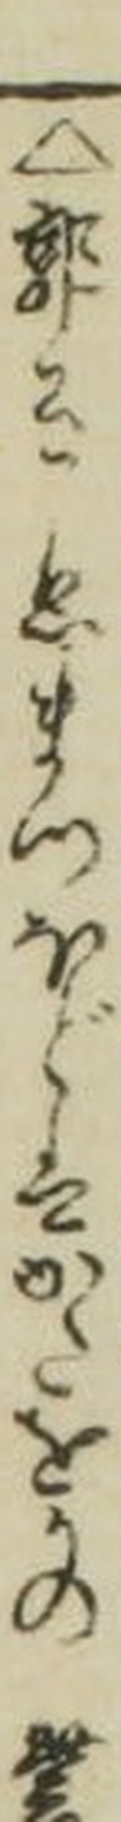△郭公こゑまつほどはかたをかの紫
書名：女源氏教訓鑑
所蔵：東京学芸大学附属図書館
